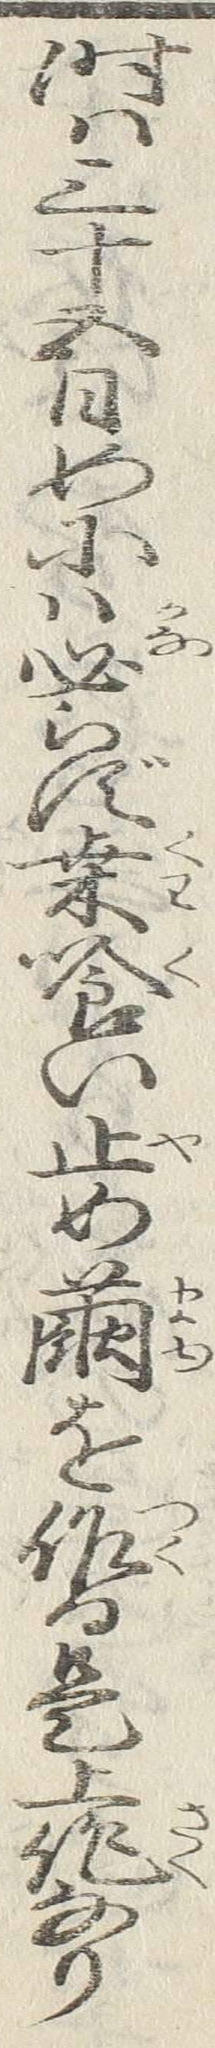時は三十五日めには必らず桒喰い止め繭を作る是上作なり
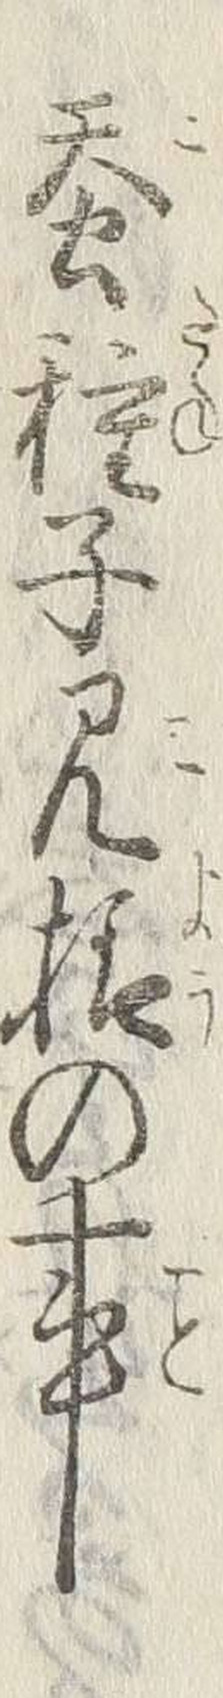蚕種子見様の事
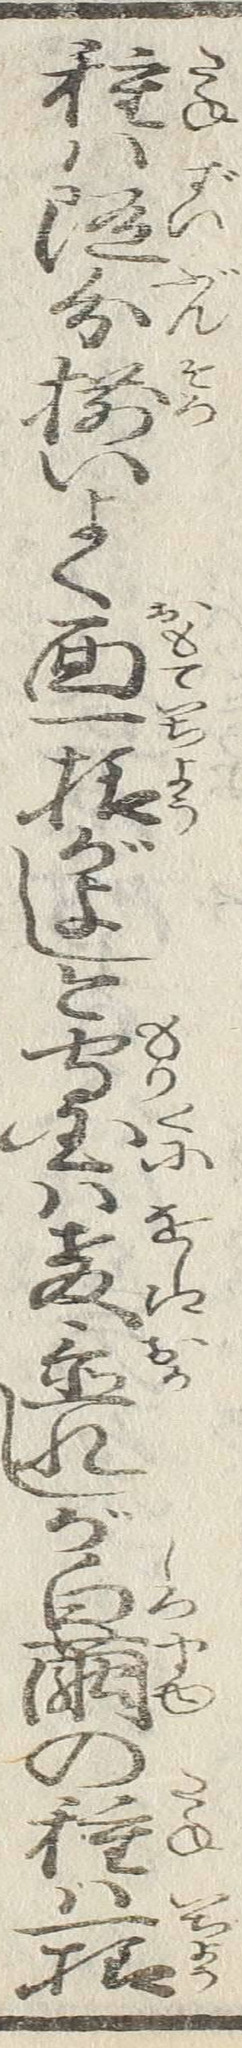種は随分揃いよく面一様がよしと守国は教置れしが白繭の種は一様
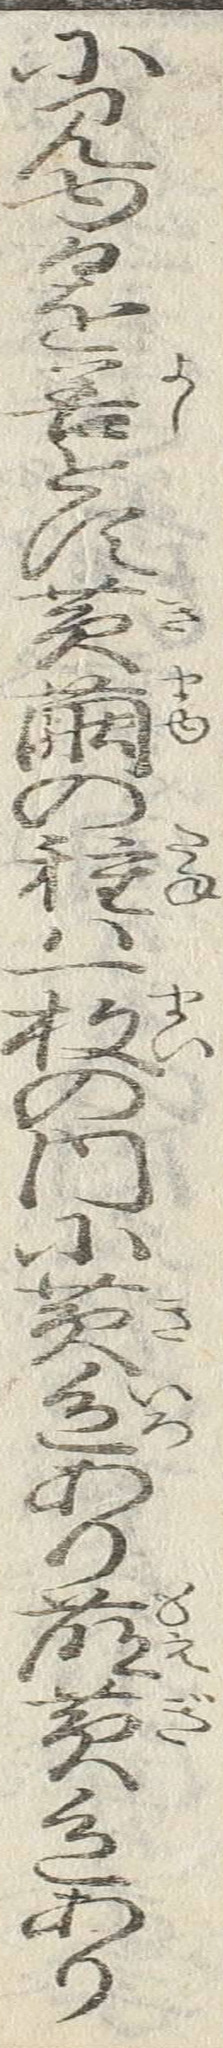に見ゆるを善とす黄繭の種は一枚の内に黄色あり萌黄色あり
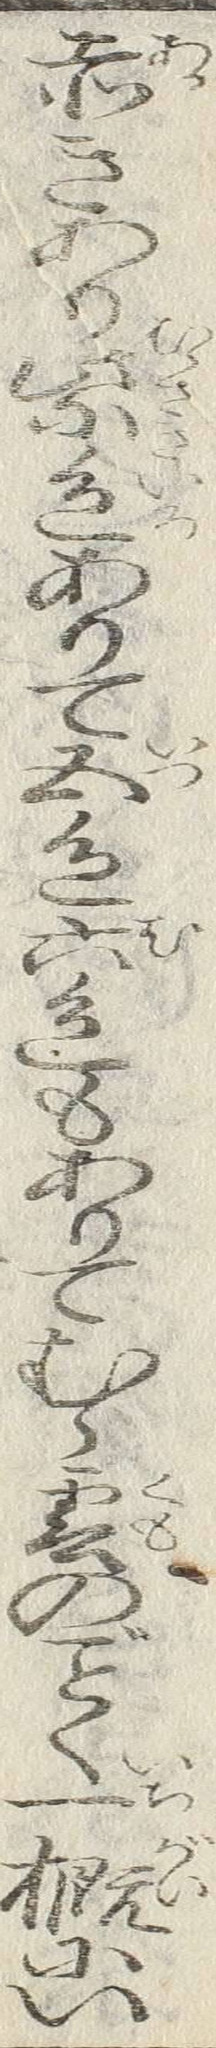赤きあり紫色ありて五色六色もありてむら雲のごとく一概にい
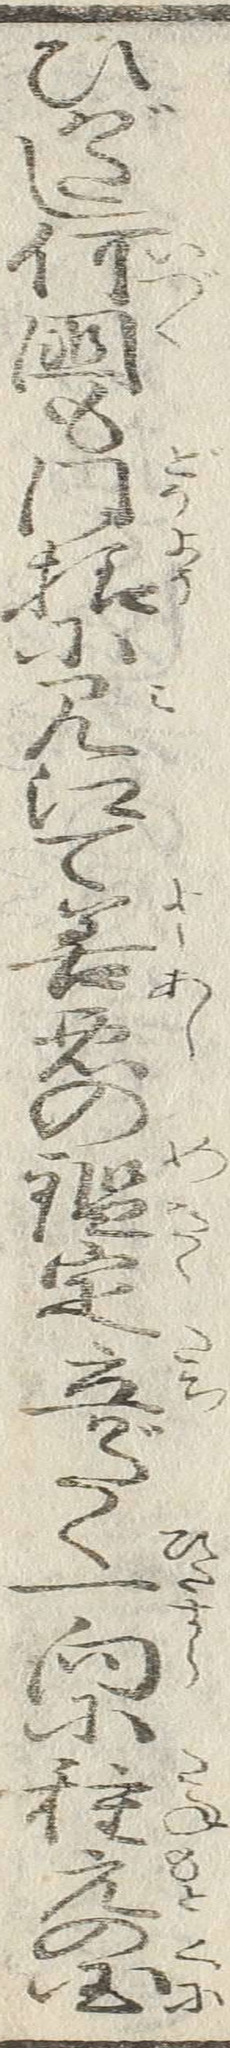ひがたし何国も同様に見えて善悪の鑑定立がたく一向に種元の国
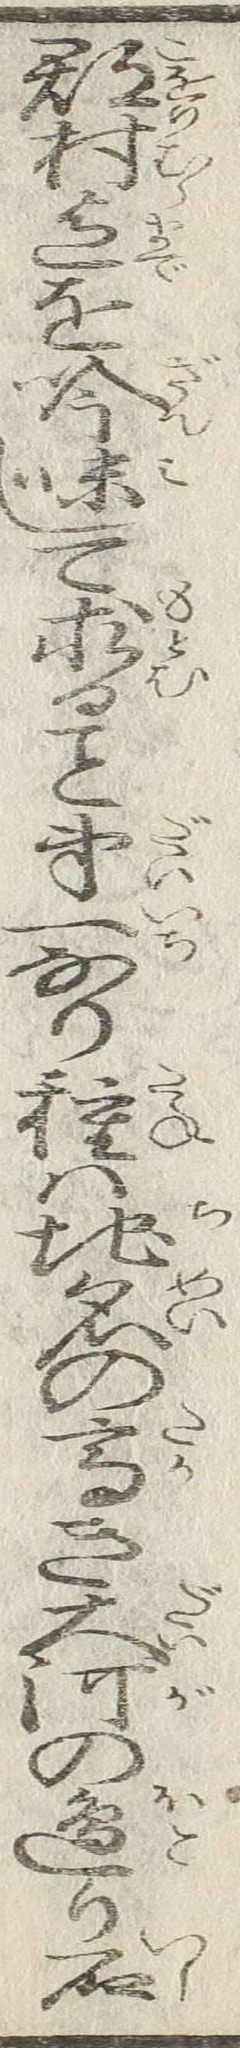郡村迄を吟味して求ること第一なり種は地名の高き大河の辺り石
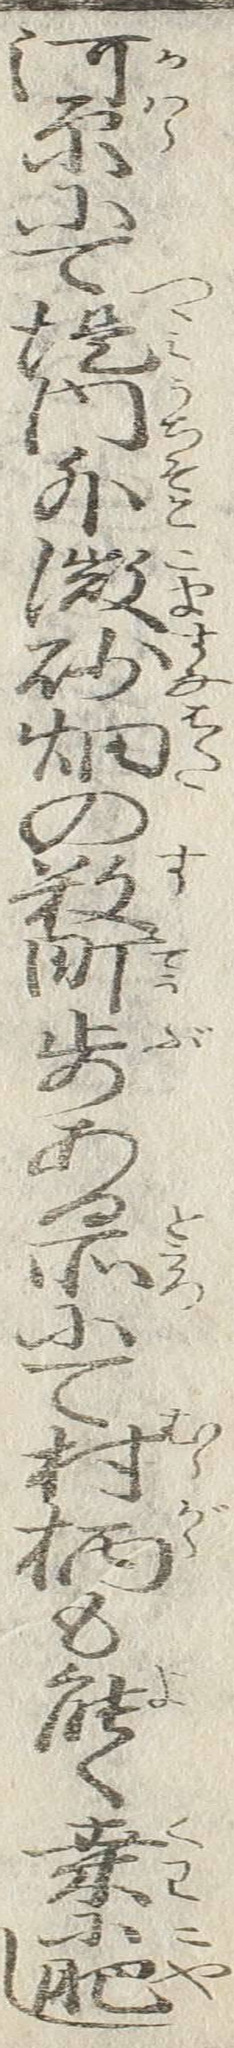河原にて堤内外微砂畑の数町歩ある所にて村柄も能く桒に肥し
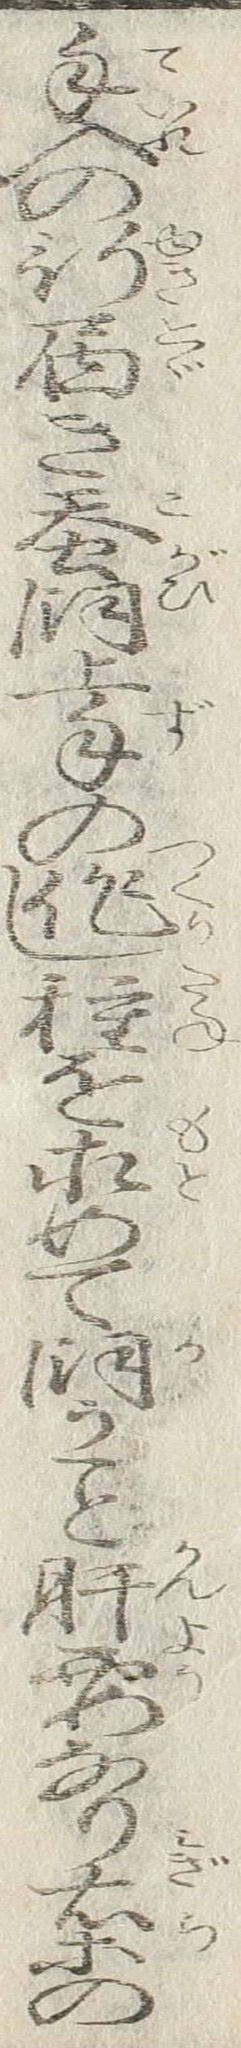手入の行届き蚕飼上手の作し種を求めて飼うこと肝要なり右等の
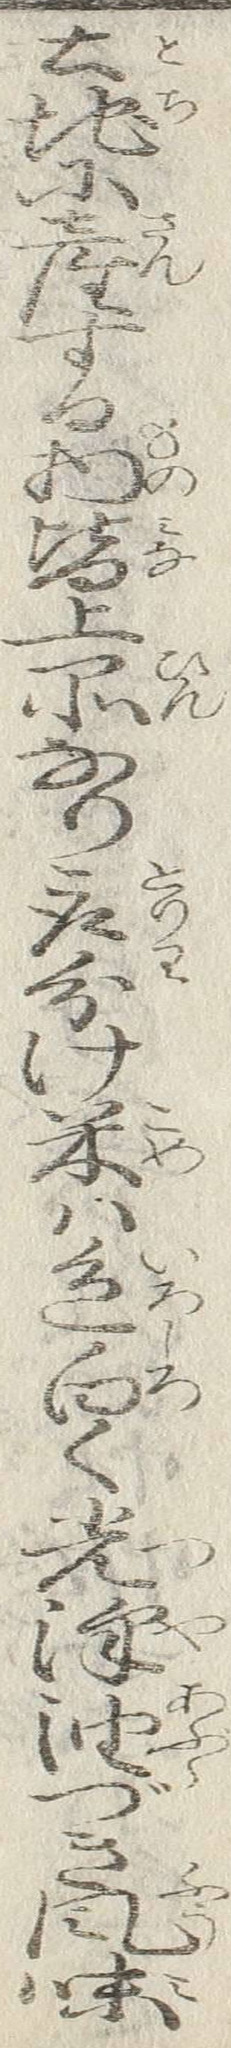土地に産する物皆上品なり取分け米は色白く光澤油づき風味
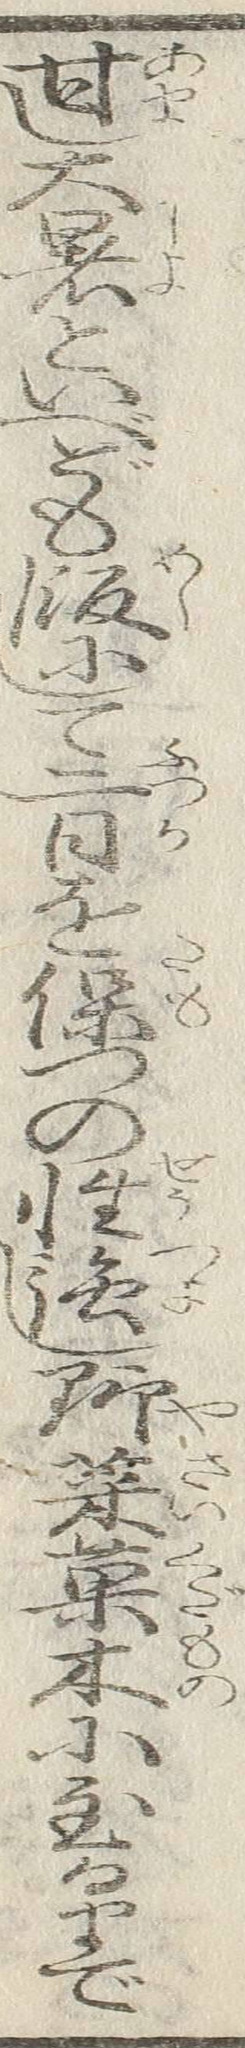甘し大暑といべども飯にして二日を保つの性強し野菜菓木に至るまで
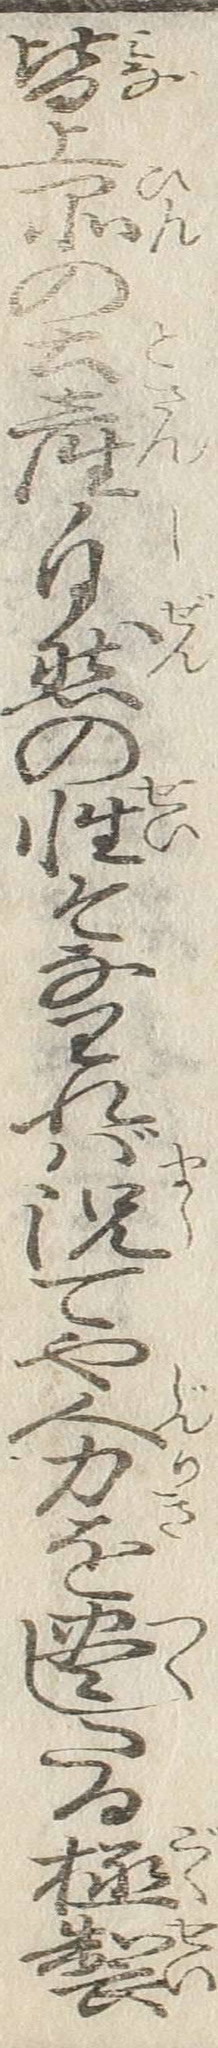皆上品の土産自然の性そなわれば況てや人力を尽したる極製
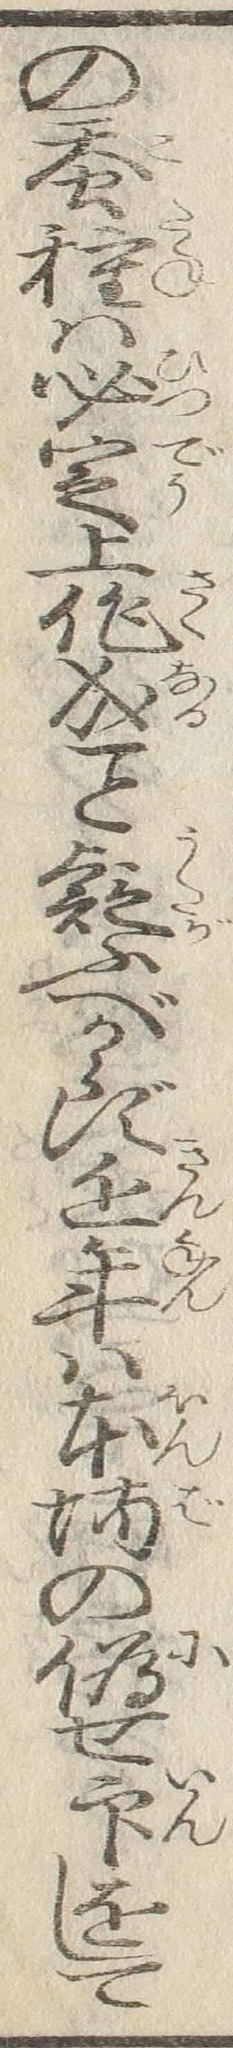の蚕種は必定上作成こと疑ふべからず近年は本場の偽せ印をして

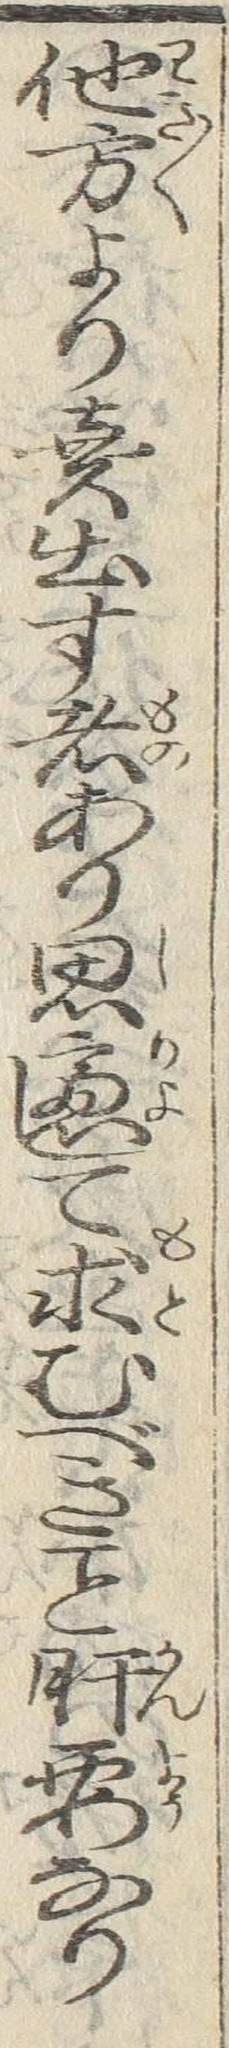他方より賣出す者あり思慮して求むべきこと肝要なり
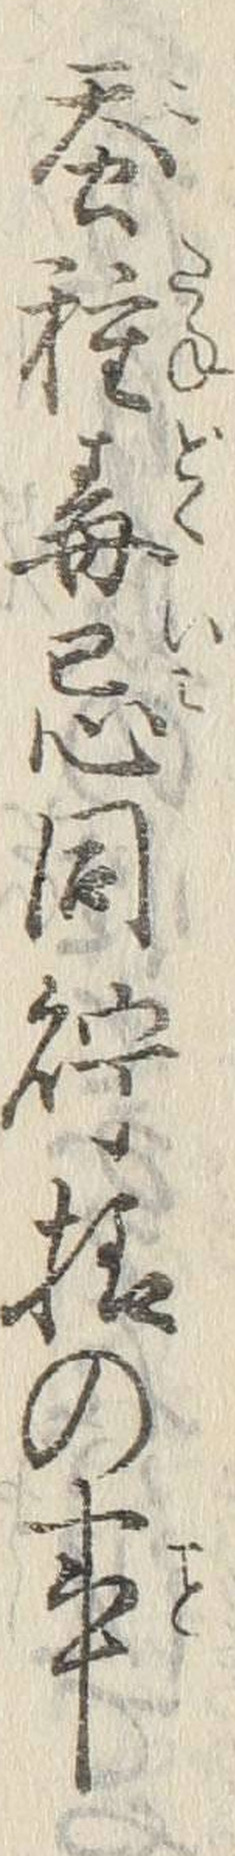蚕種毒忌同貯様の事
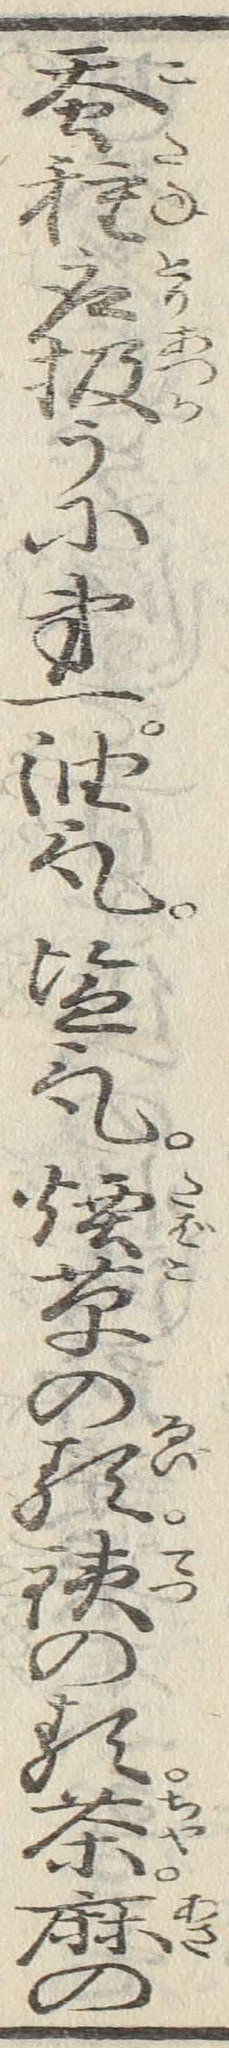蚕種取扱うに㐧一。油気。塩気。煙草の類。銕の類。茶。麻の
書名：養蠶實驗録
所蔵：東京大学農学生命科学図書館 国文学研究資料館
